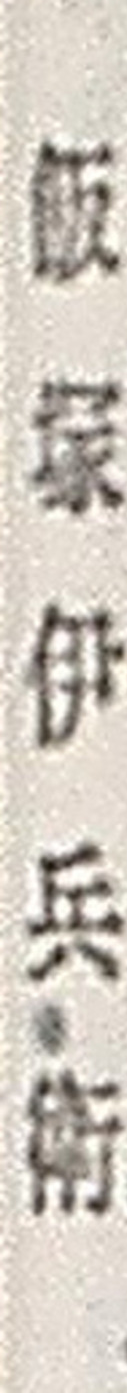飯塚伊兵衛
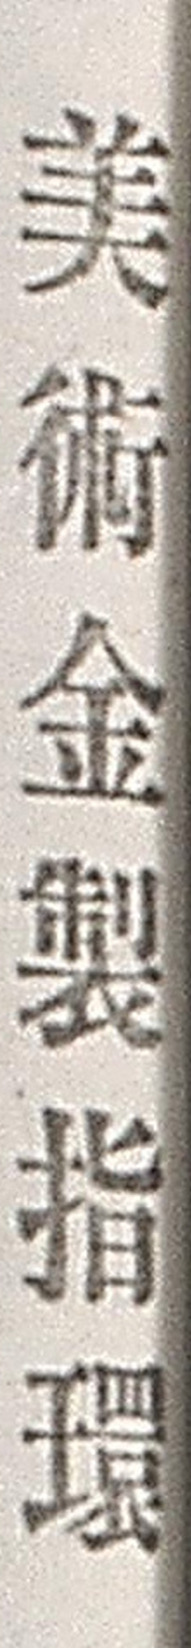美術金製指環
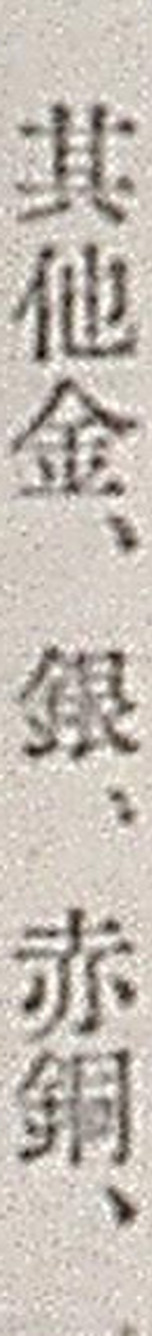其他金、銀、赤銅、
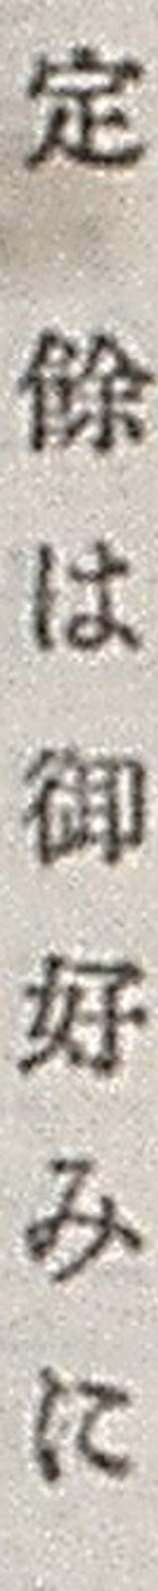余は御好みに
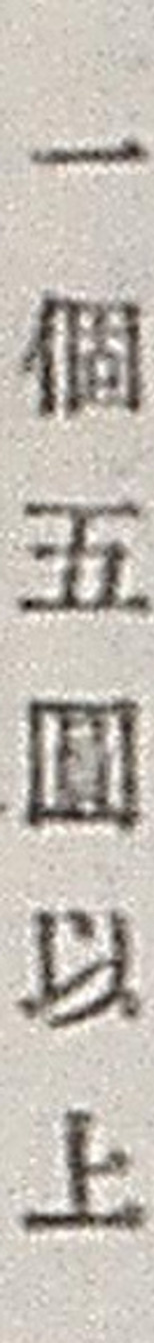一個五円以上
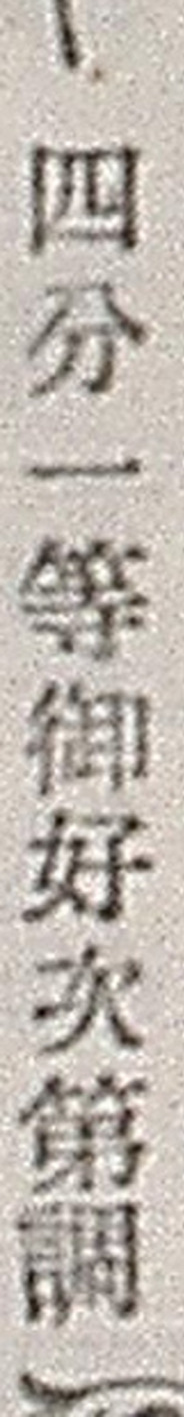四分一等御好次第調
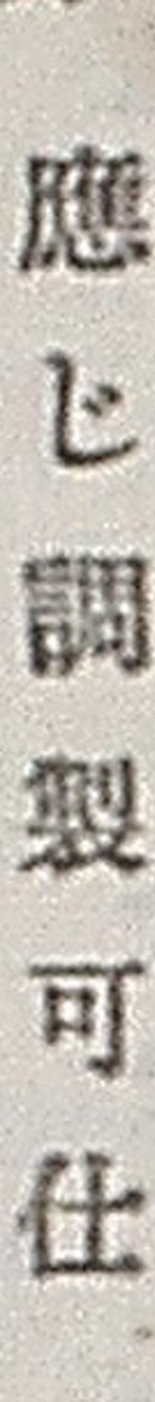応じ調製可仕
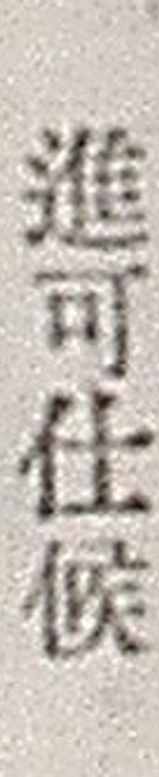進可仕候
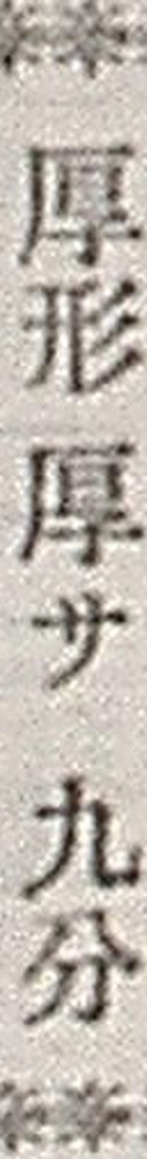厚形暑サ九分
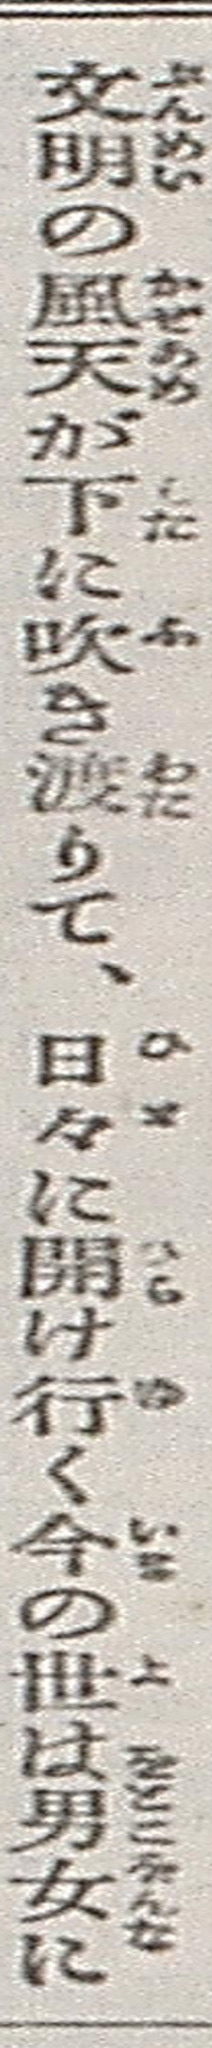文明の雨天が下に吹き渡りて、日々に開け行く今の世は男女に
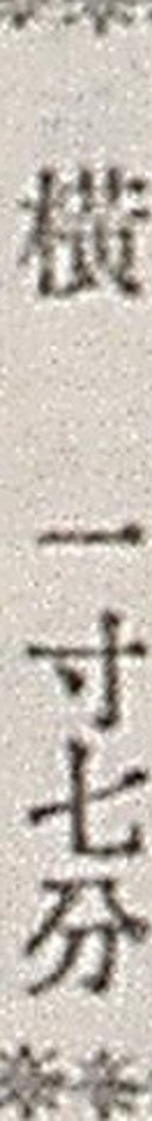横一寸七分
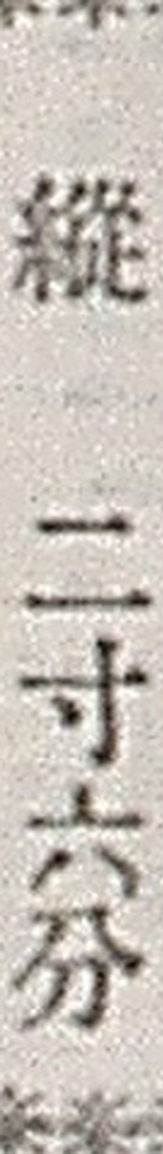楯二寸六分
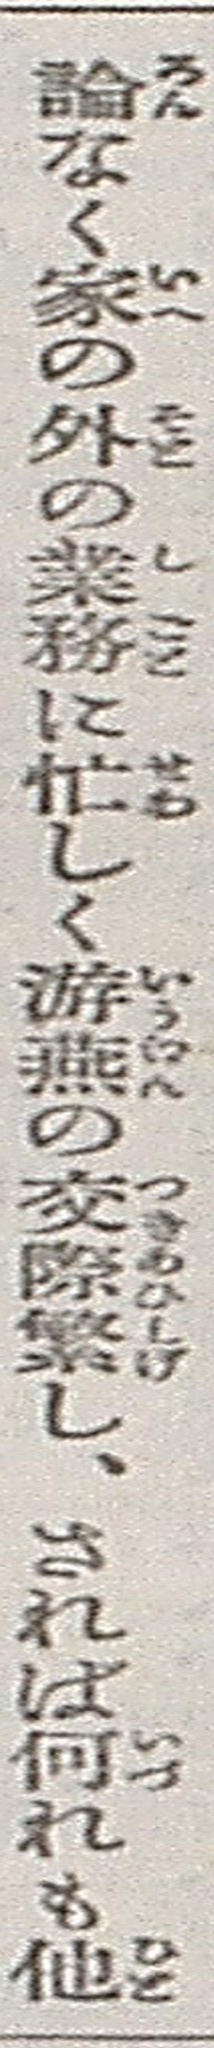論なく家の外の業務に忙しく游燕の交際繁し、されば何れも他
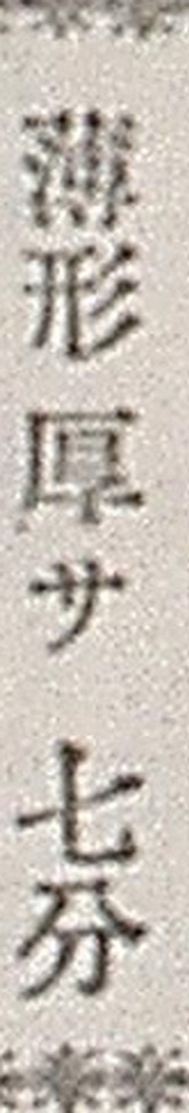薄形厚サ七分
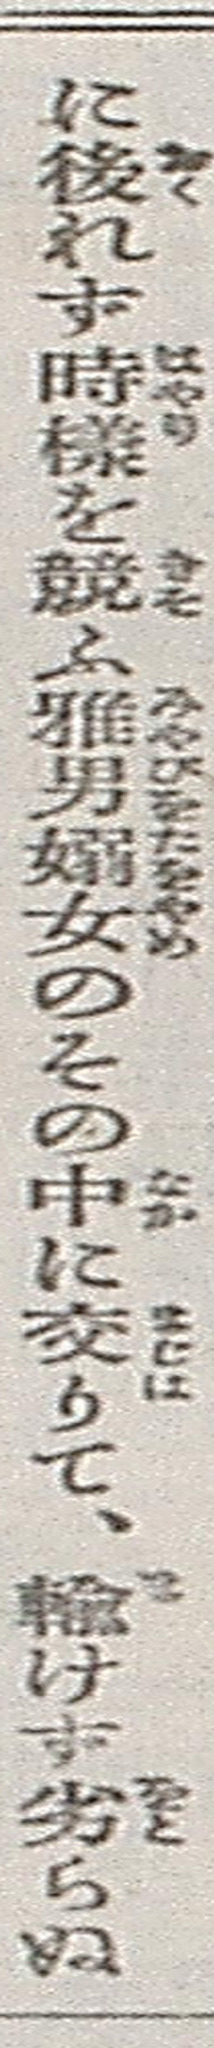に後れず時様を競ふ雅男媚女のその中に交りて、輸けず劣らぬ
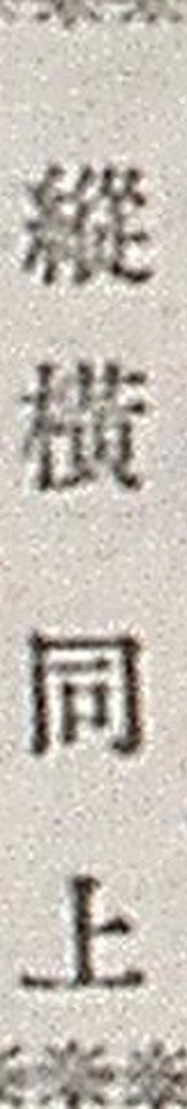縦横同上
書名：風俗畫報臨時増刊第百二十號　大海嘯被害録（下）
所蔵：東京大学地震研究所図書室 Earthquake Research Institute Library, The University of Tokyo, JAPAN
